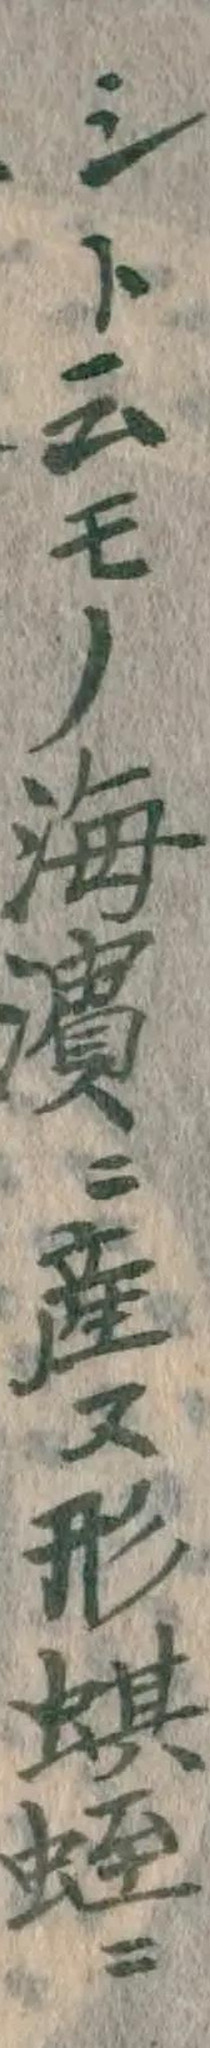シト云モノ海浜ニ産ス形蜞蛭ニ
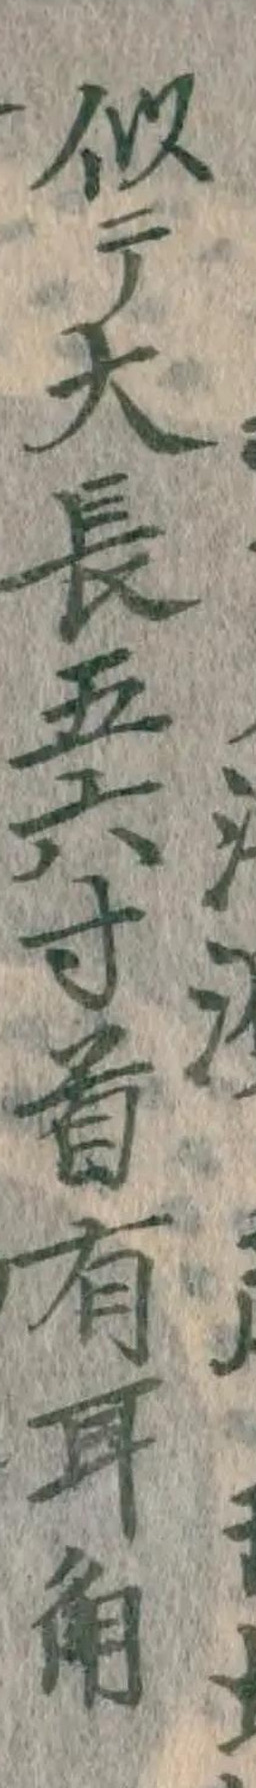似テ大長五六寸首有耳角
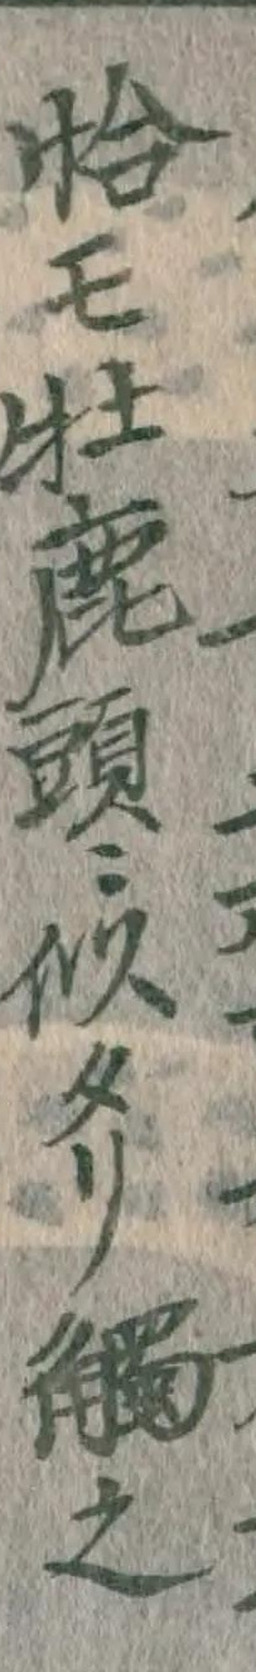恰モ牡鹿頭ニ似タリ触之
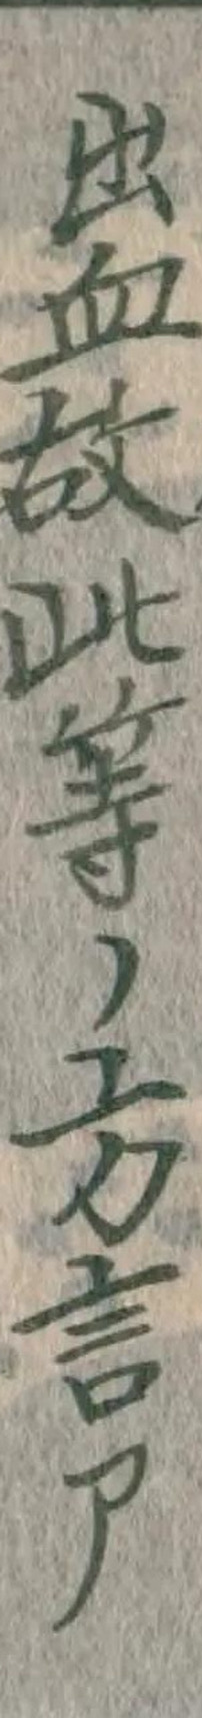出血故此等ノ方言ア
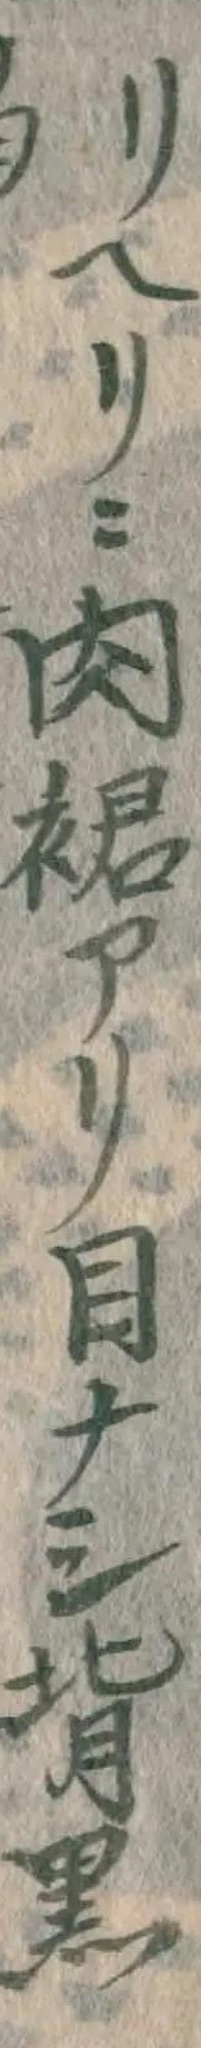リヘリニ肉裙アリ目ナシ背黒
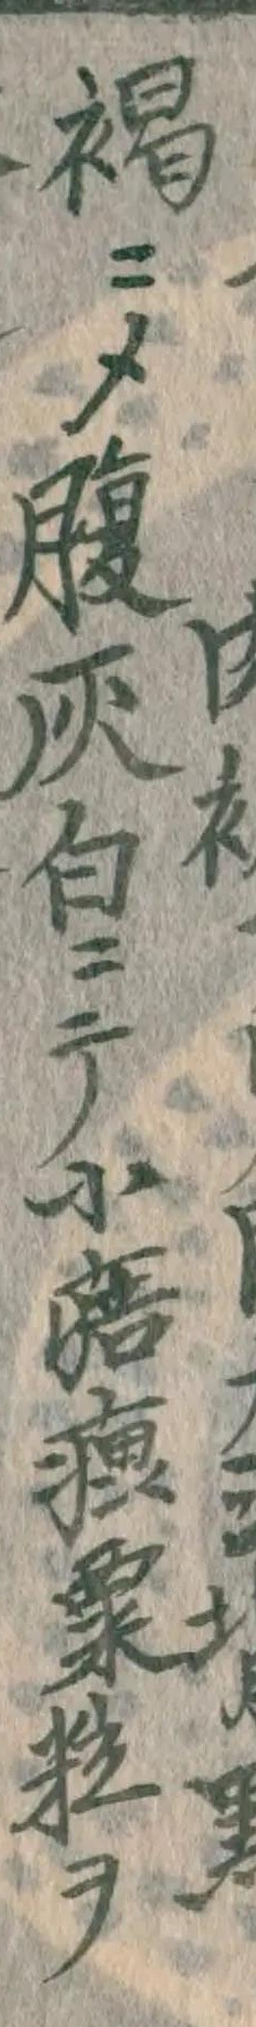褐ニシテ腹灰白ニテ小㾦㿔粟粒ヲ
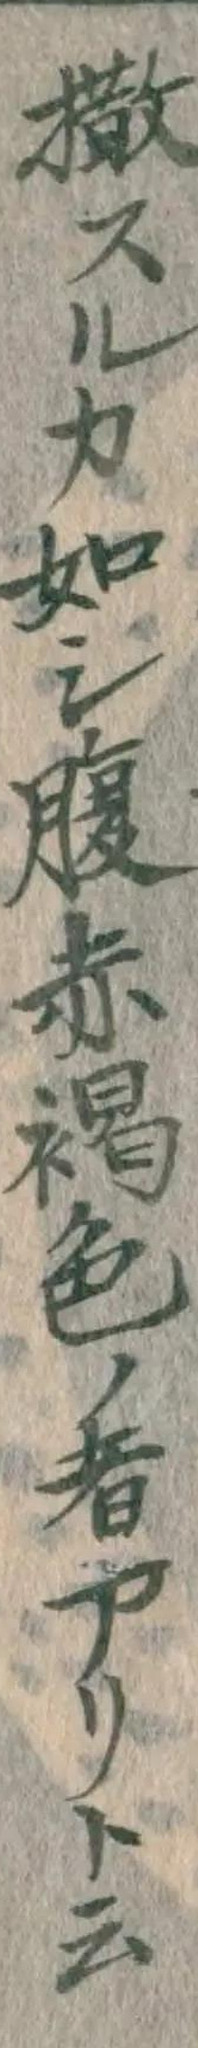撒スルカ如シ腹赤褐色ノ者アリト云
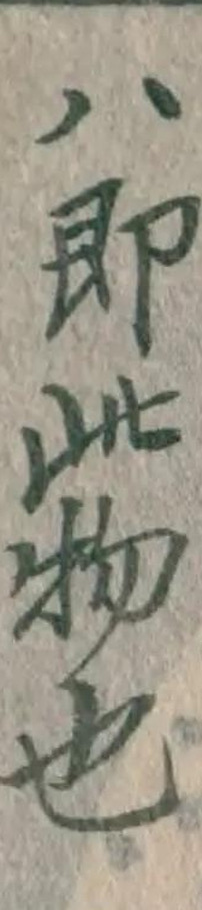ハ即此物也

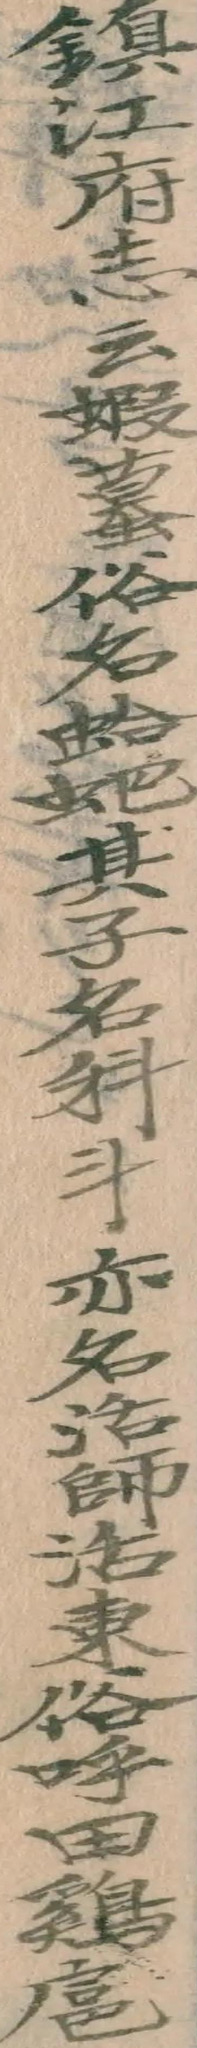鎮江府志云蝦蟇俗名蛤蚆其子名科斗亦名活師活東俗呼田鶏扈

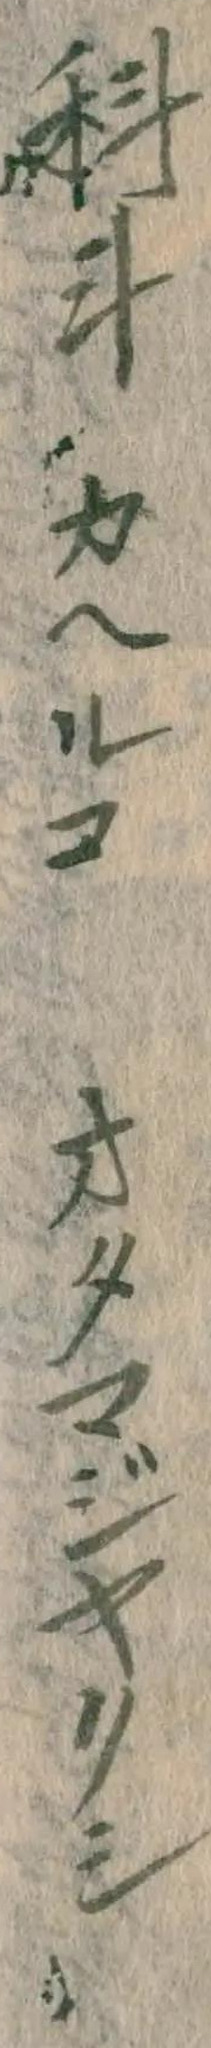科斗カヘルコオタマジヤクシ
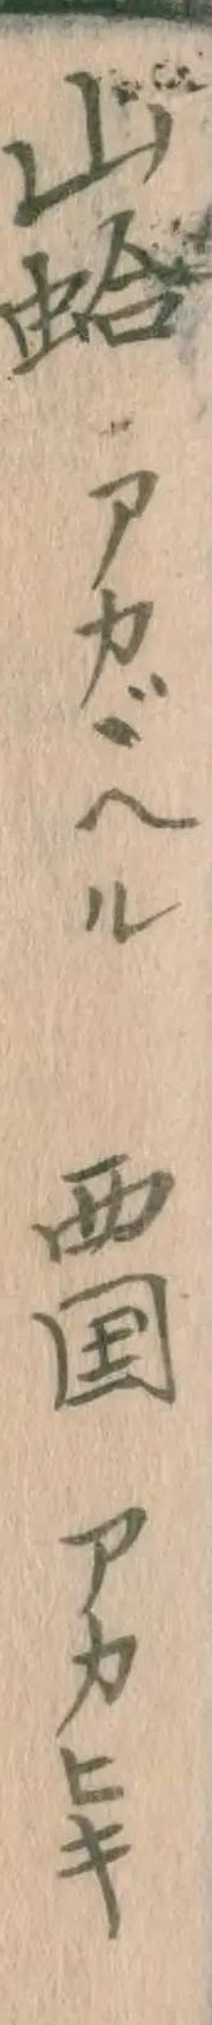山蛤アカヾヘル西国アカヒキ
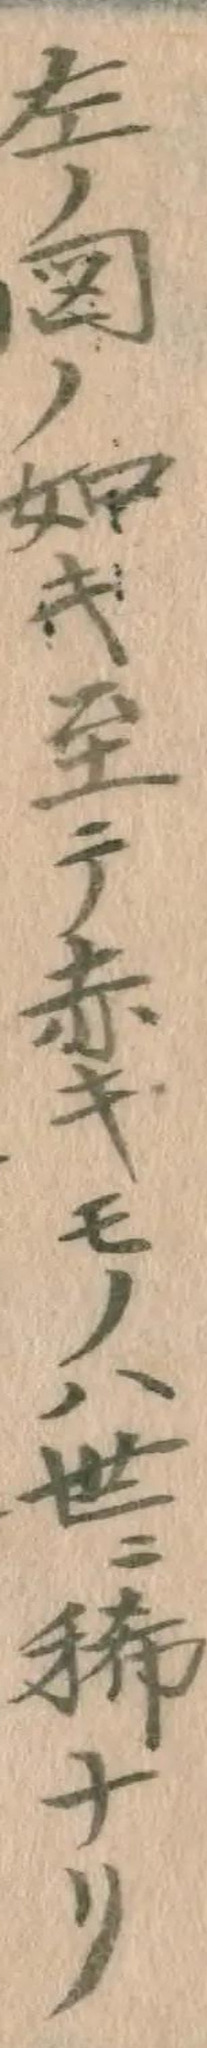左ノ図ノ如キ至テ赤キモノハ世ニ稀ナリ
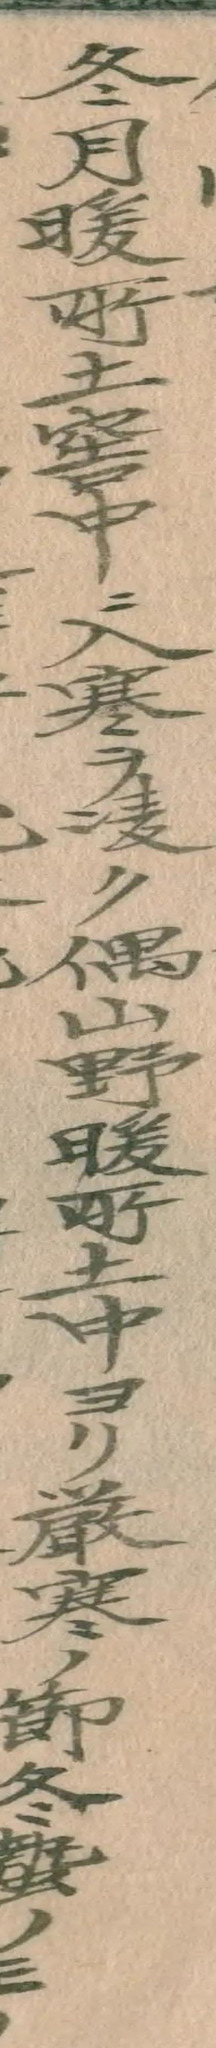冬月暖所土窖中ニ入寒ヲ凌ク偶山野暖所土中ヨリ厳寒ノ節冬蟄ノモノ
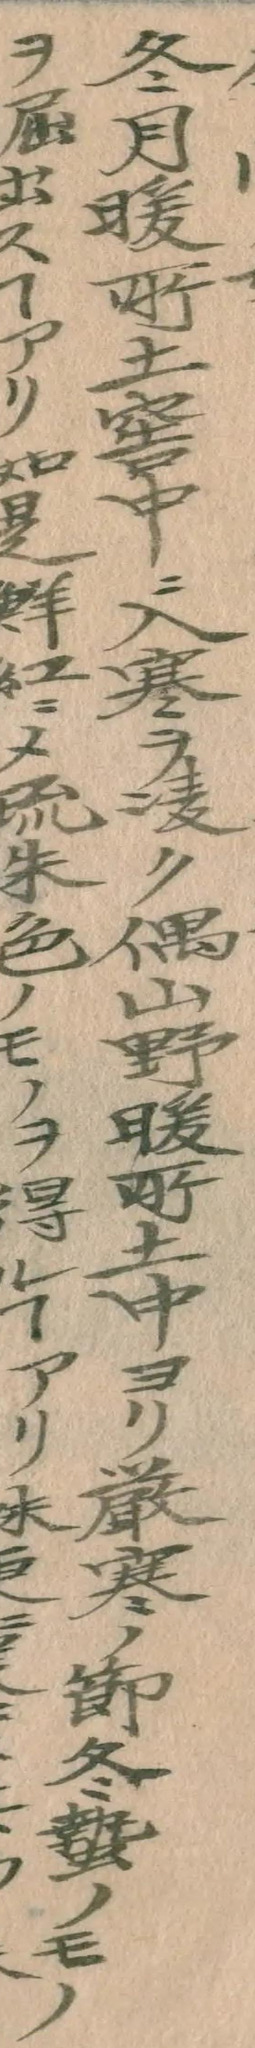冬月暖所土窖中ニ入寒ヲ凌ク偶山野暖所土中ヨリ厳寒ノ節冬蟄ノモノ
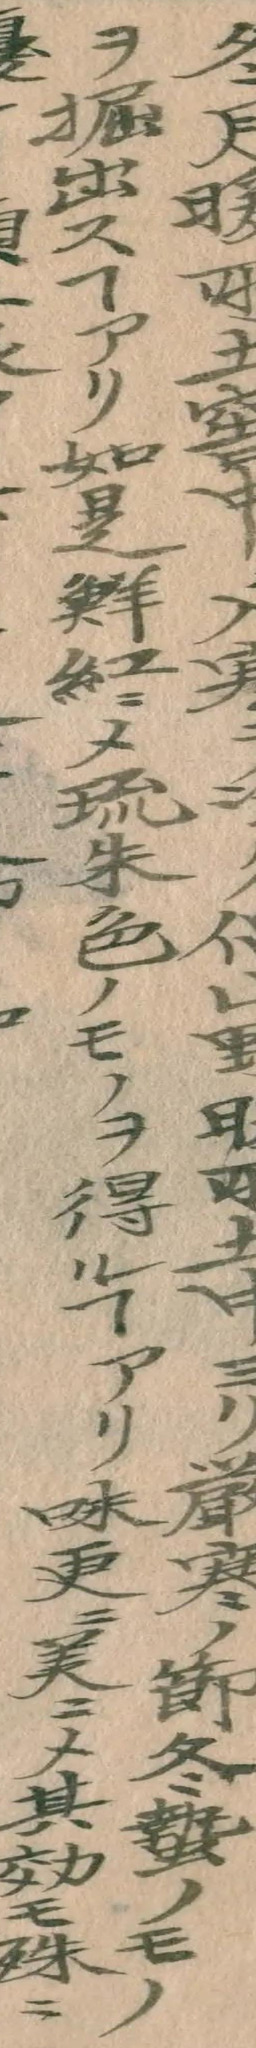ヲ掘出スコトアリ如是鮮紅ニシテ琉朱色ノモノヲ得ルコトアリ味更ニ美ニシテ其効モ殊ニ
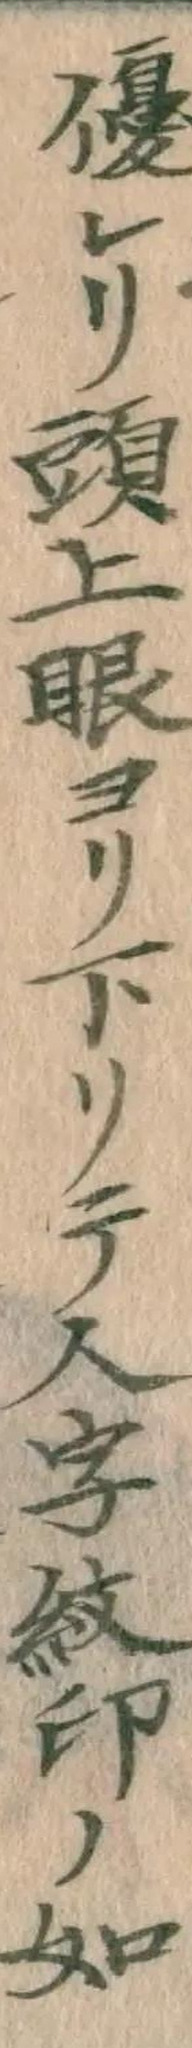優レリ頭上眼ヨリ下リテ人字紋印ノ如
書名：千蟲譜 3巻. [3]
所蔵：国立国会図書館 National Diet Library, JAPAN
